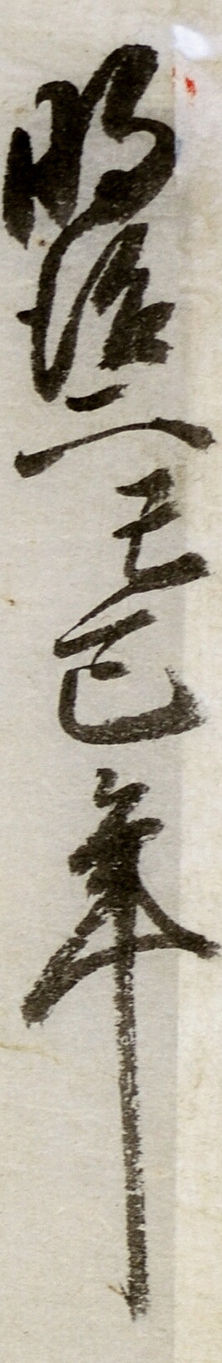明治二己巳年
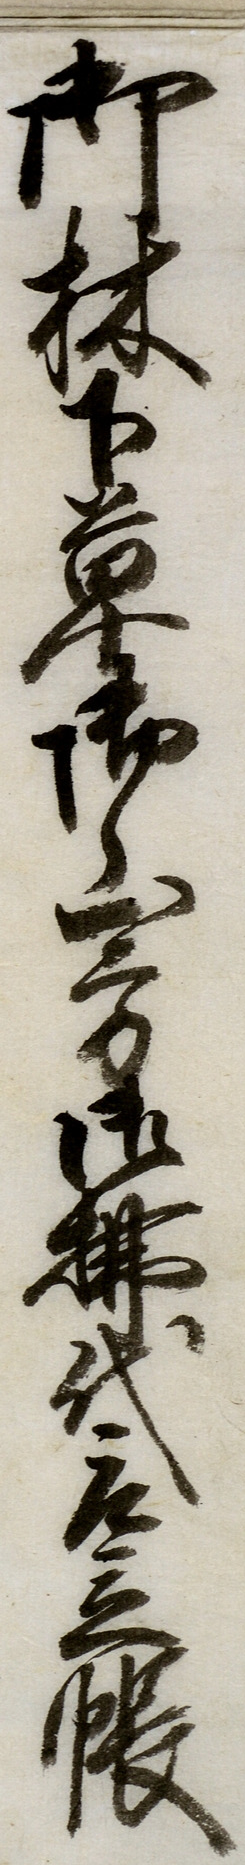御林下草御山方御払代取立帳
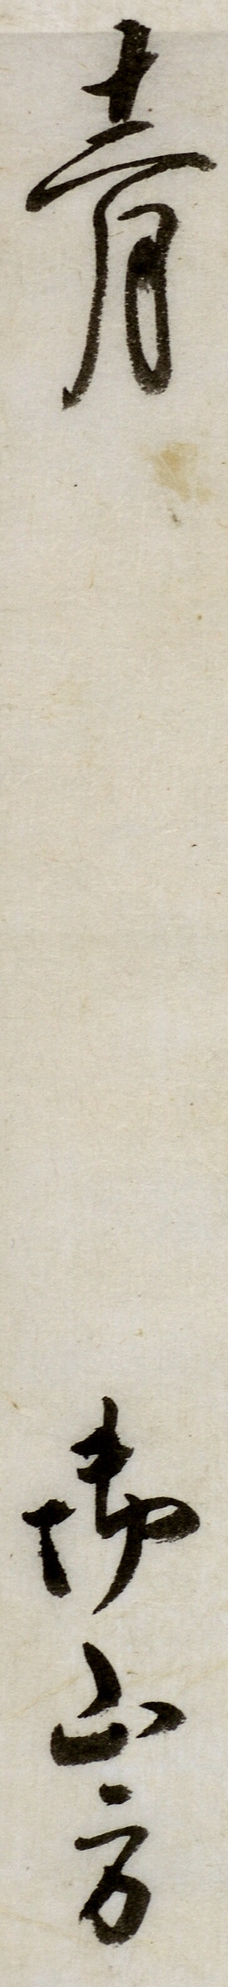十二月御山方
